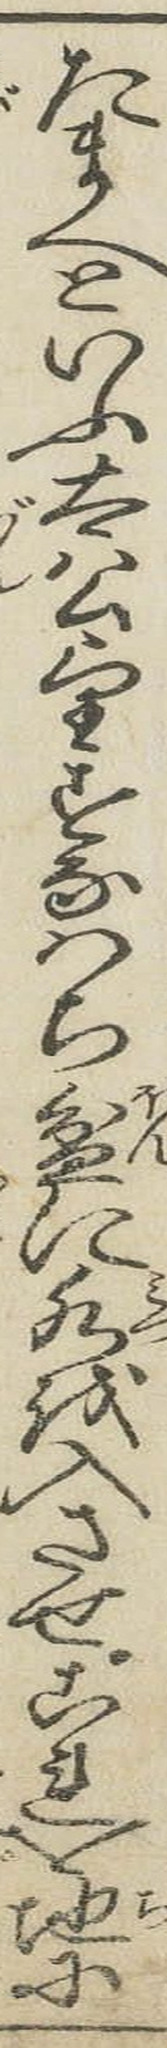たまへといふ太公望すなはち盆に水を入させ。これを地に
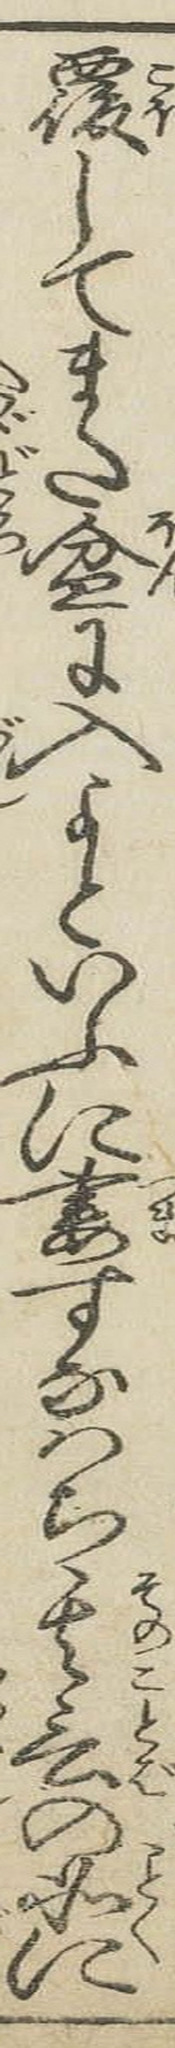覆してまた盆に入よといふに妻すなはち其言の如に
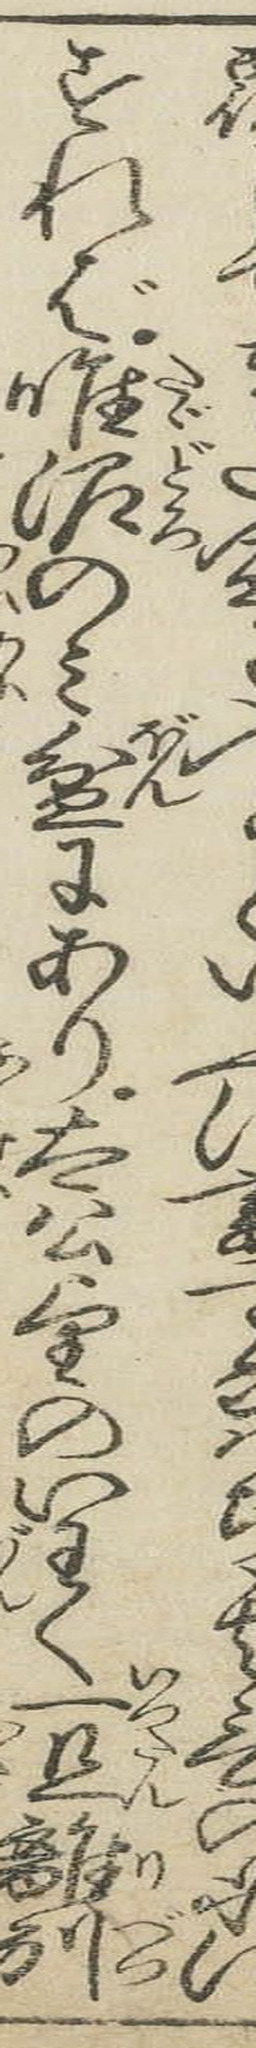すれば。唯泥のみ盆にあり。太公望のいわく一旦離別
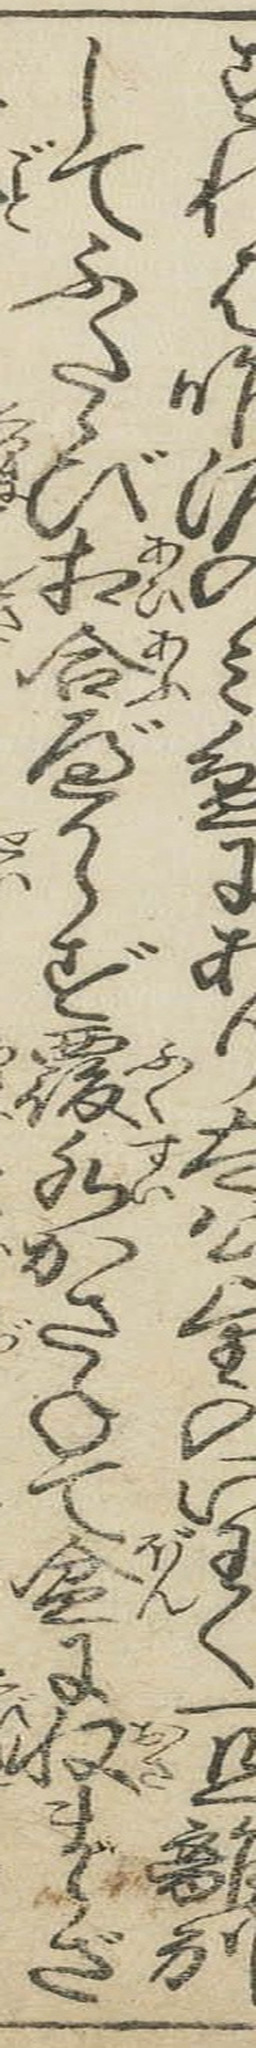してふたゝび相合べからず覆水かさねて盆に收まらざ
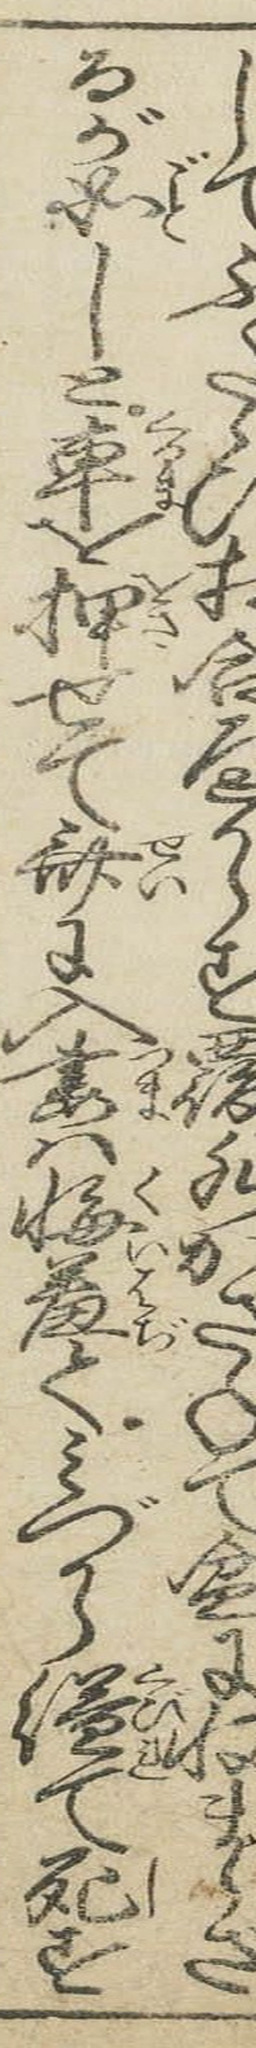るが如しと。車を押せて斉に入妻は悔羞て。みづから縊て死す
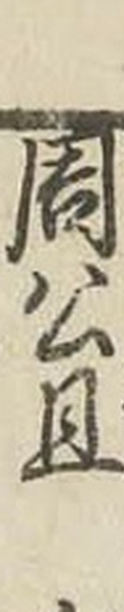周公旦
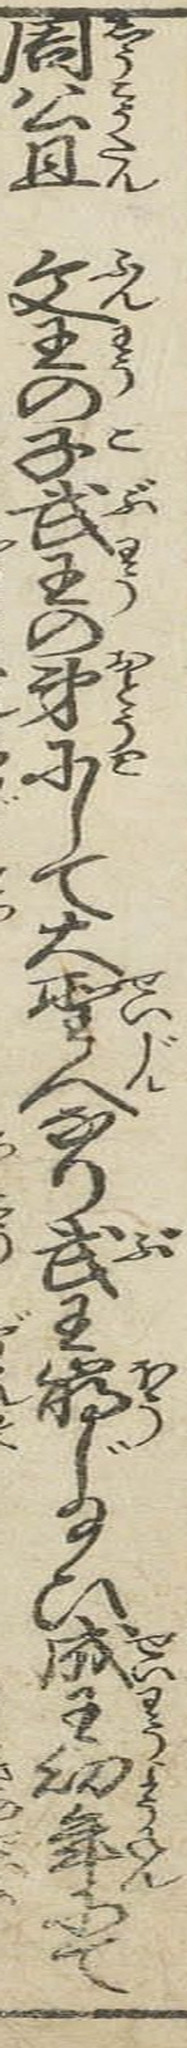周公旦文王の子武王の弟にして大聖人なり武王崩じ給ひ成王幼年にて
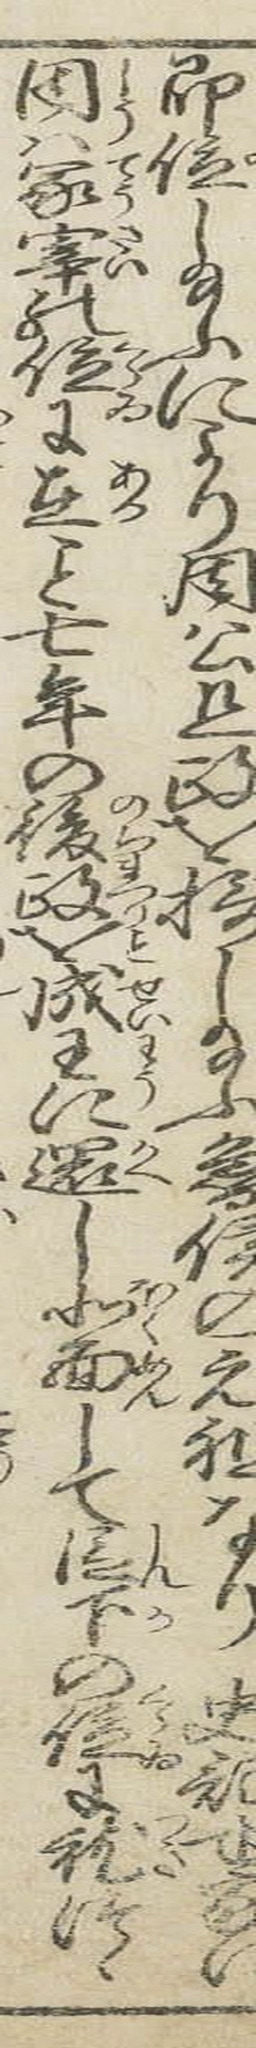周は冢宰の位に在こと七年の後政を成王に還し北面して臣下の位に就つゝ
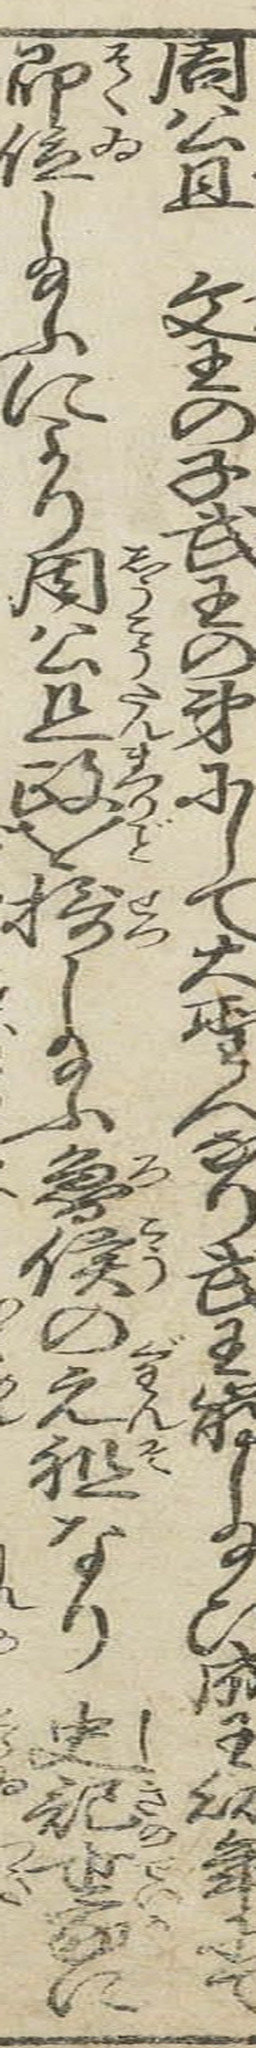即位し給ふにより周公旦政を摂し給ふ魯侯の元祖なり史記世家に
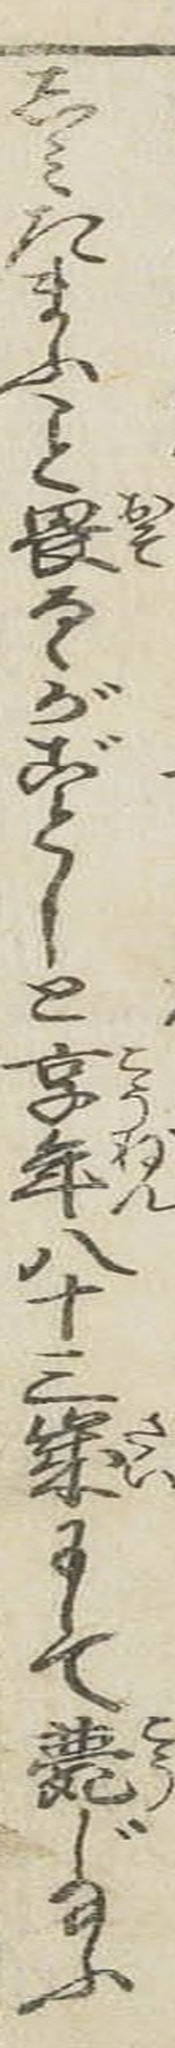しみたまふこと畏るゝがごとしと享年八十三歳にして薨じ給ふ
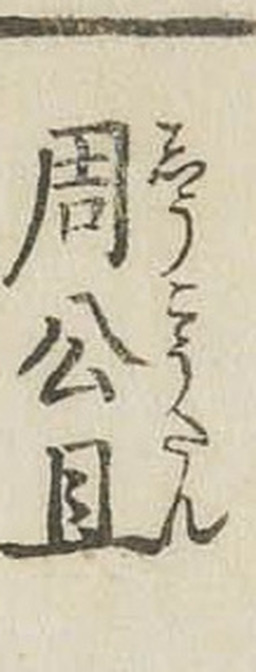周公旦
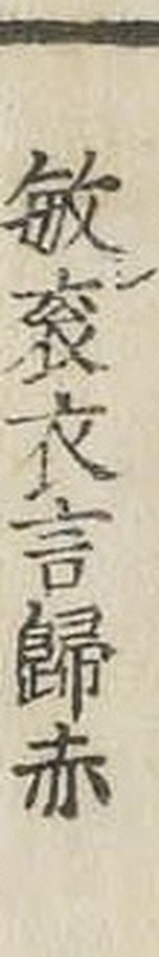敏衮衣言帰赤

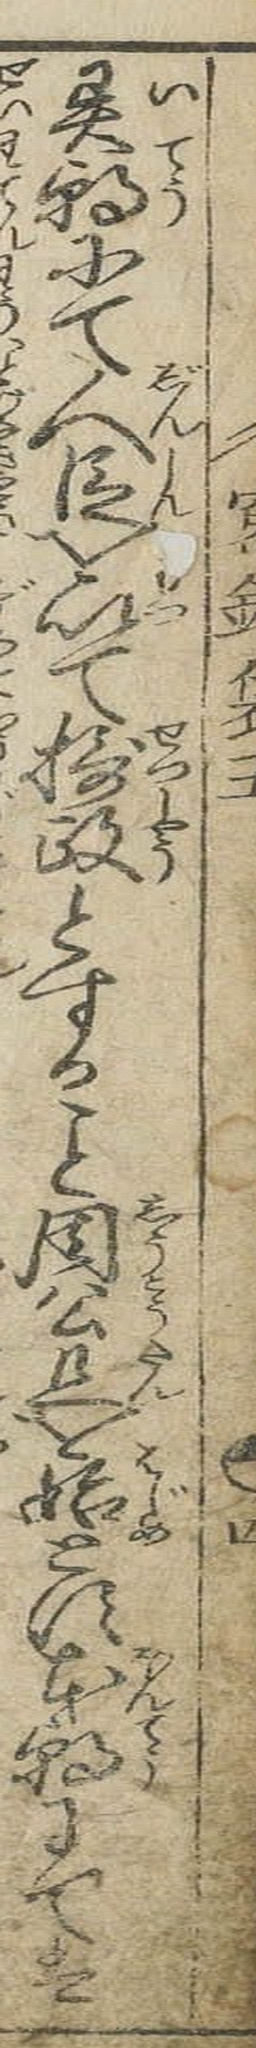異朝にて人臣を以て摂政とすること周公旦を始とす本朝にては
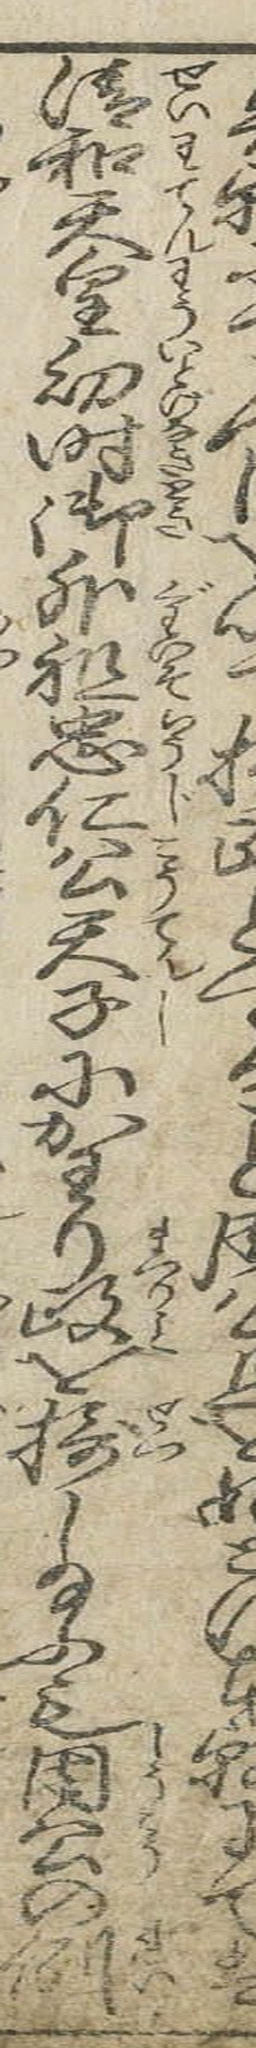清和天皇幼時御外祖忠仁公天子にかわり政を摂し給ふも周公の例
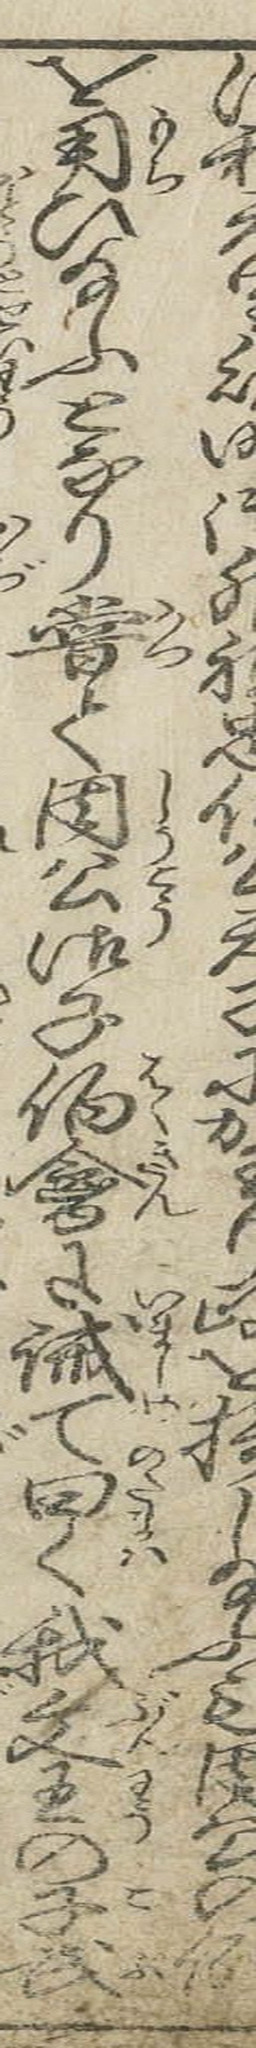を用ひ給ふとなり嘗て周公御子伯禽に誡めて曰く我文王の子武
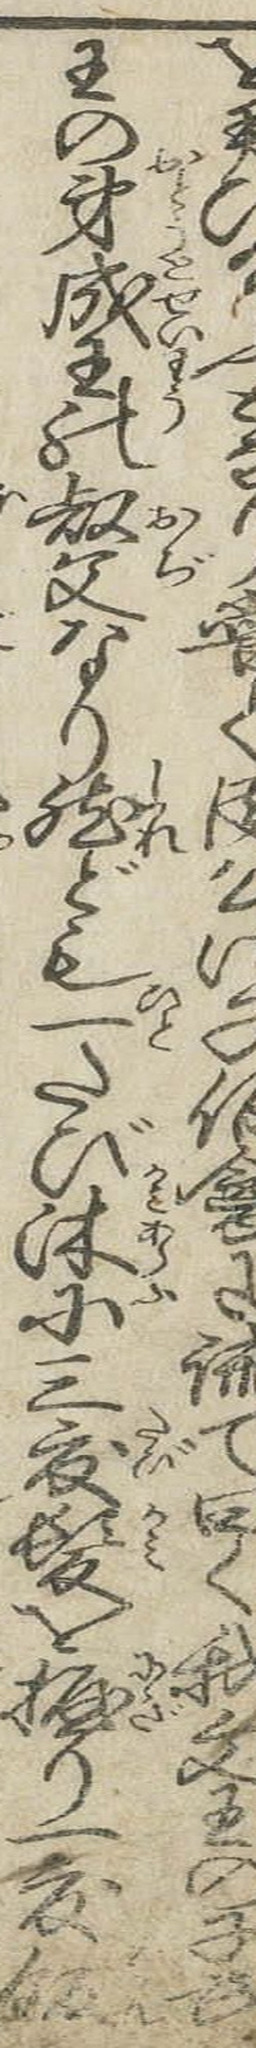王の弟成王の叔父なり然ども一たび沐に三度髪を握り一度飯
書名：絵本写宝袋 9巻 5之巻
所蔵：東京学芸大学教育コンテンツアーカイブ
